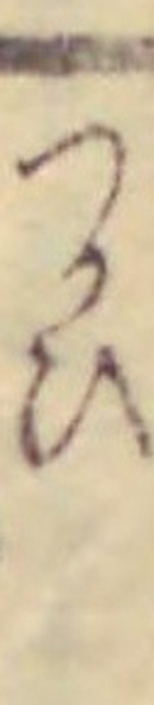つかひ
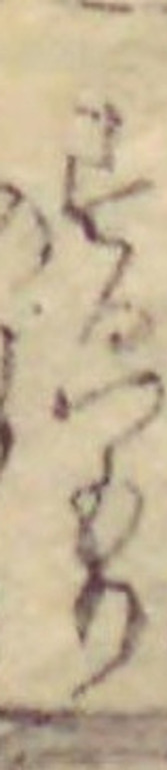するつもり
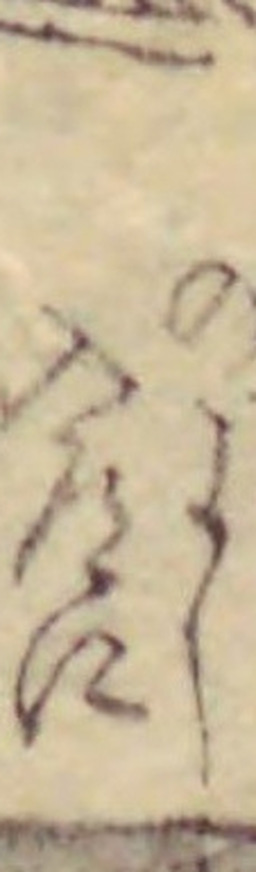入道に
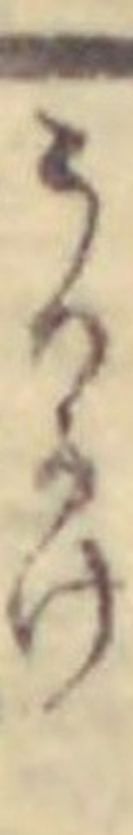うりかけ
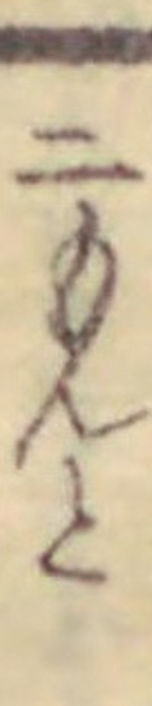二もんと
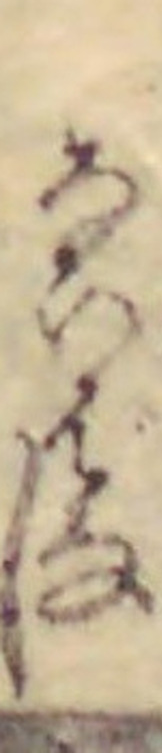ないばなし
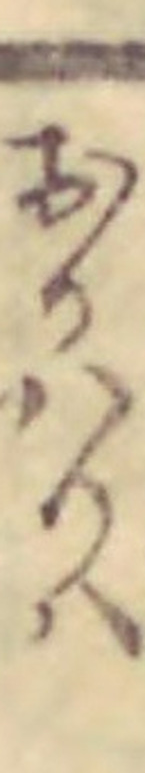おかはりは
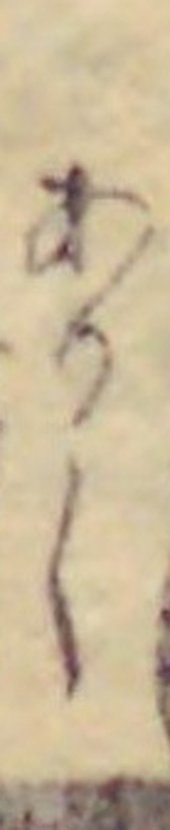ありし
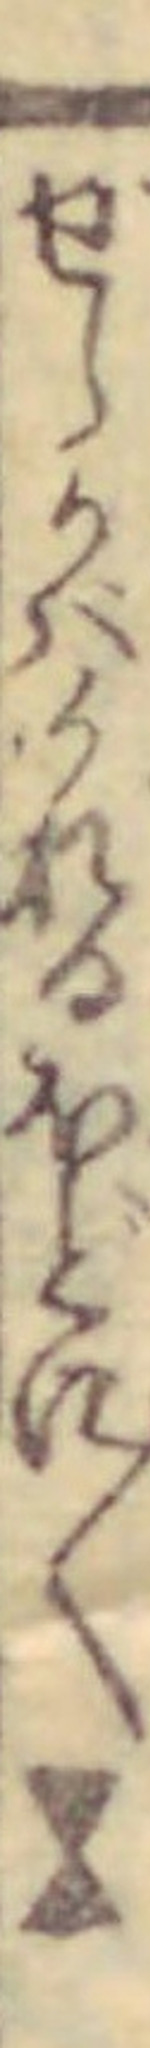せしかはうれるほどに〳〵▼▲
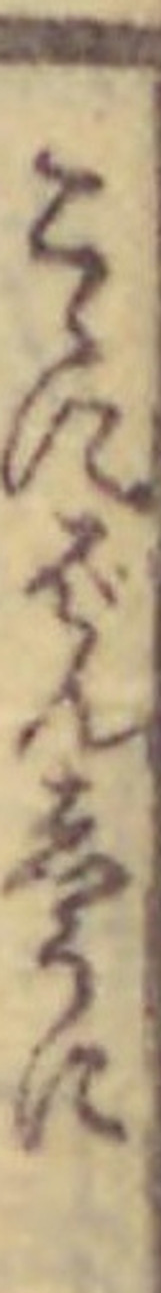こゝにばんしうに
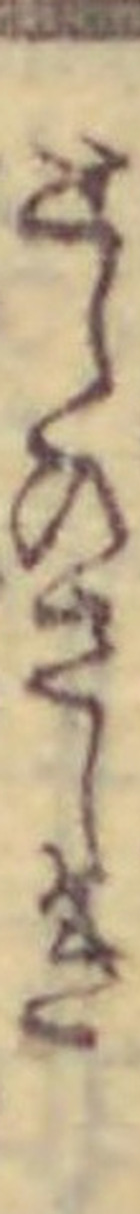としひさしき
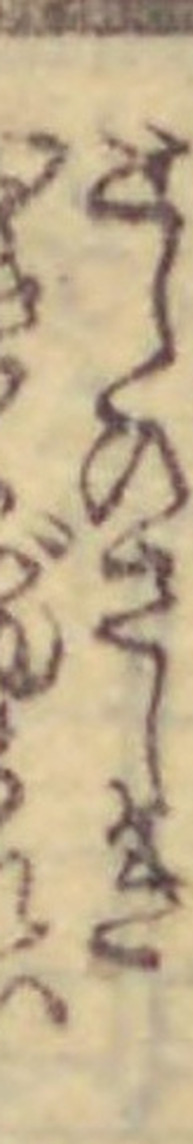としひさしき
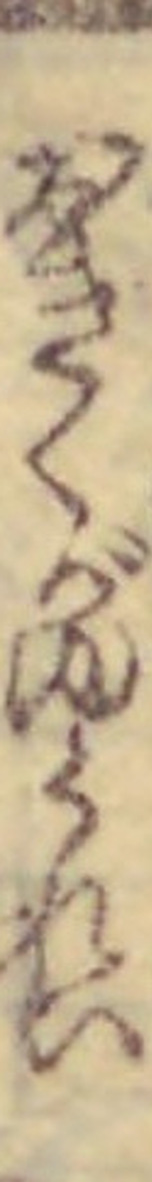おきくがゆうれい
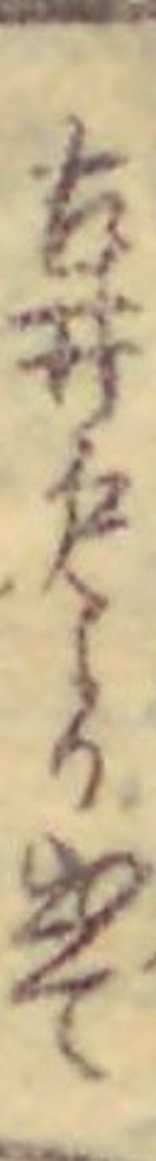古井戸より出て
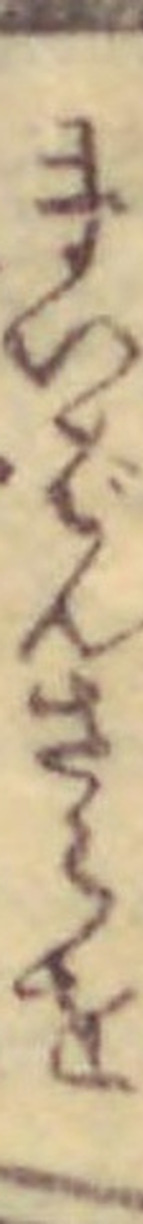まいばんさらを
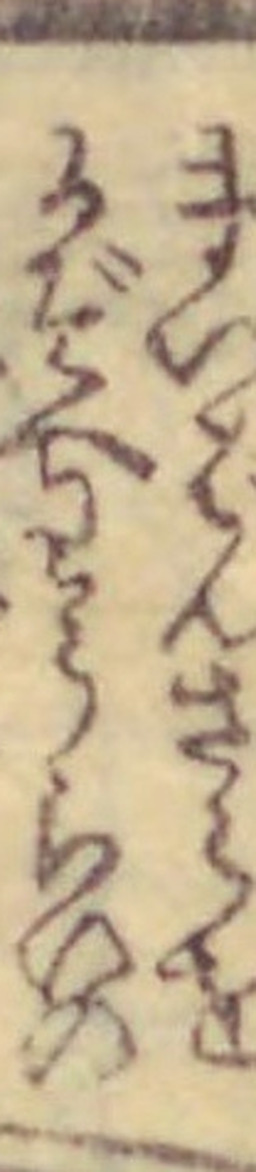かぞへわうらいの
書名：化物世帯氣質
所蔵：国立国会図書館 National Diet Library, JAPAN
